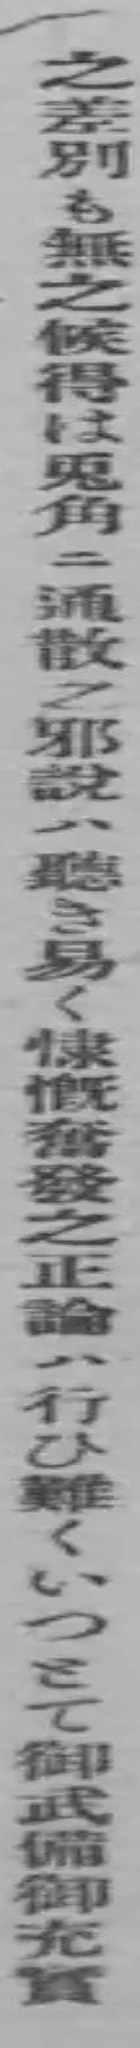之差別も無之候得は兎角ニ通散之邪説ハ聞き易く慷慨奮発之正論ハ行ひ難くいつとて御武備御充実
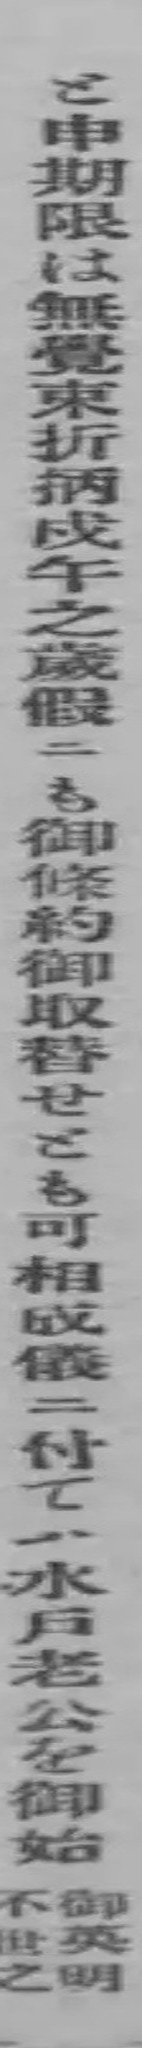と申期限は無覚束折柄戌午之歳仮ニも御条約御取替せとも可相成候ニ付てハ水戸老公を御始御英明不世之
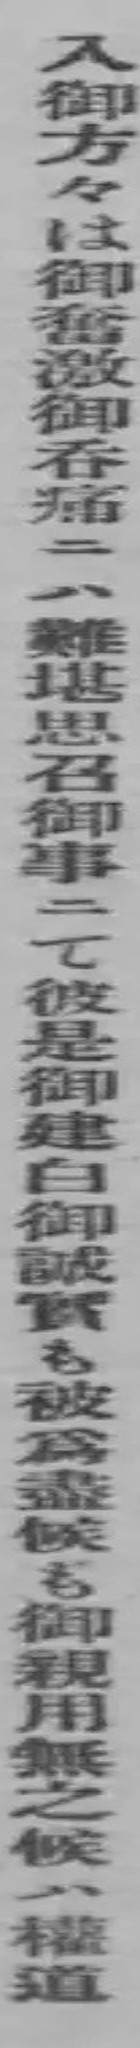入御方々は御奮激御呑痛ニハ難堪思召御事ニて彼是御建白御誠実も被為尽候も御親用無之候ハ権道
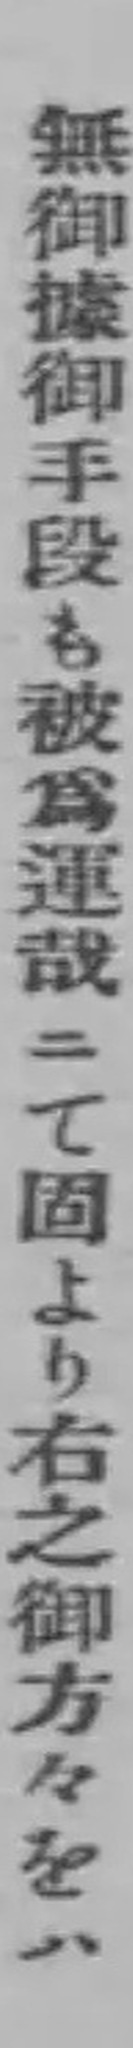無御拠御手段も被為運哉ニて固より右之御方々をハ
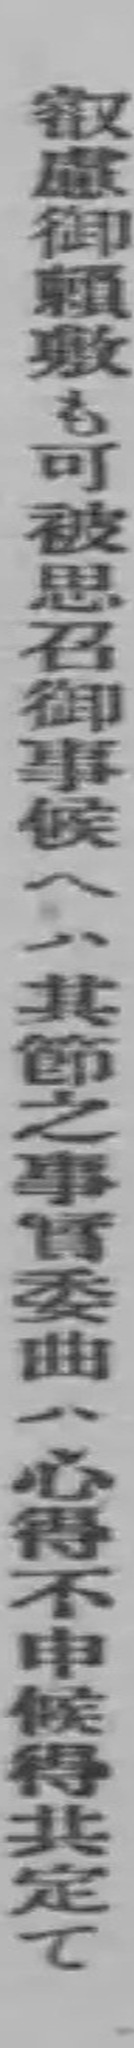叡慮御頼敷も可被思召御事候ヘハ其節之事実委曲ハ心得不申候得共定て
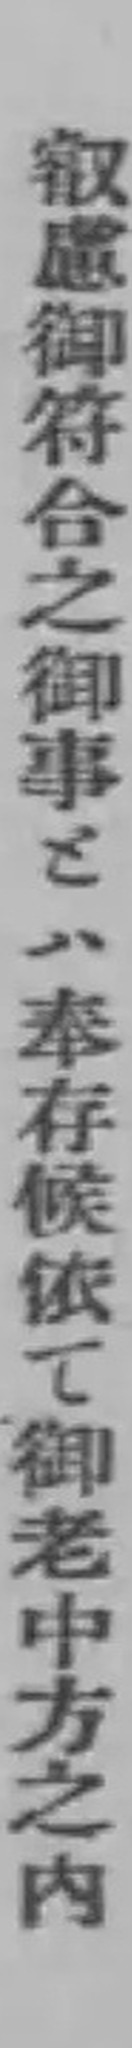叡慮御符号之御事とハ奉存候依て御老中方之内
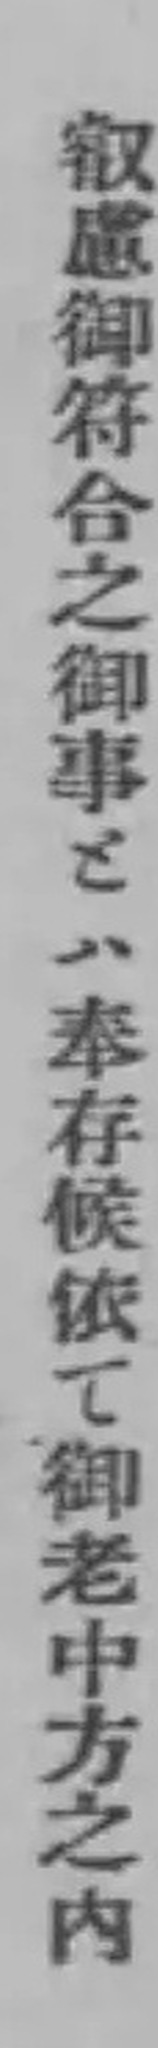叡慮御符号之御事とハ奉存候依て御老中方之内
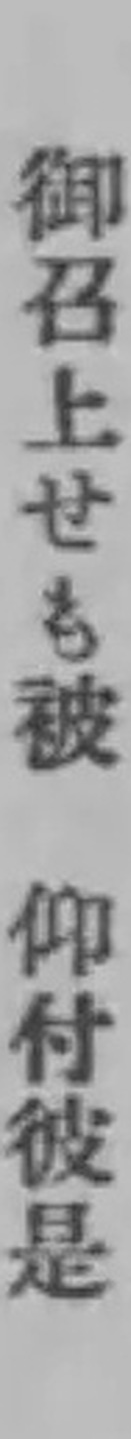御召上せも被仰付彼是
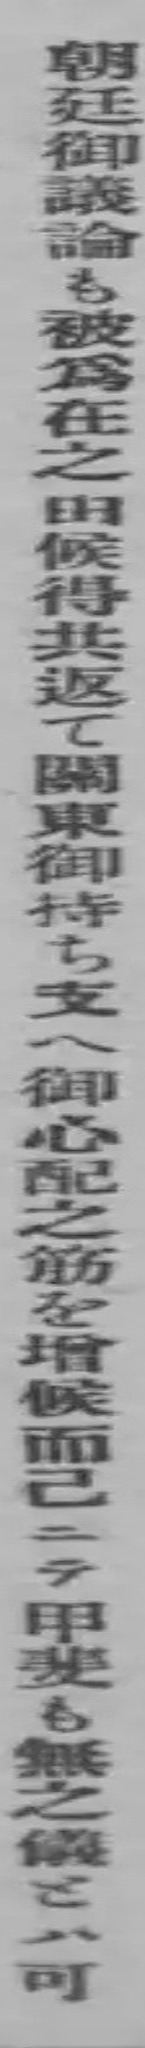朝廷御議論も被為在之由候得共返て関東御持ち支へ御心配之筋を増候而己ニテ甲斐も無之儀とハ可
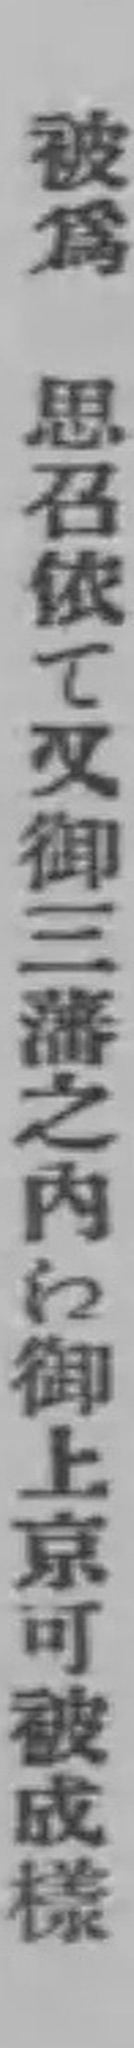被為思召依て又御三藩之内え御上京可被成様
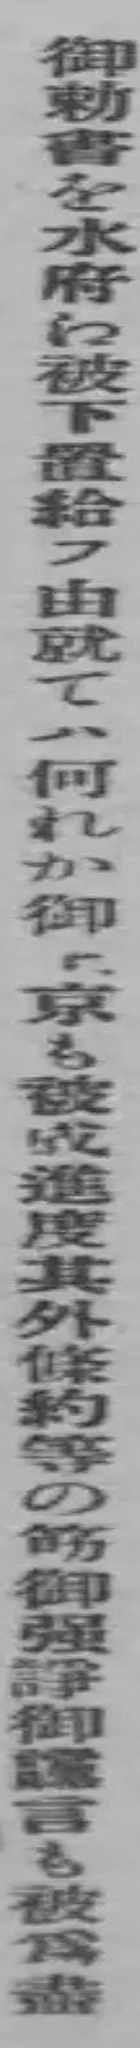御勅書を水府え被下置給フ由就てハ何れか御上京も被成進度其外条約等の筋御強諍御謹言も被為尽

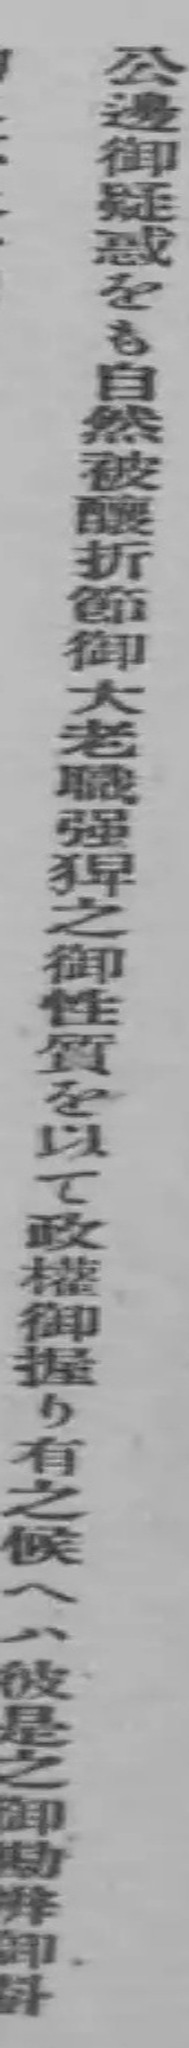公辺御疑惑をも自然被醸折節御大老職強猂之御性質を以て政権御握り有之候へは彼是之御勘弁御斟
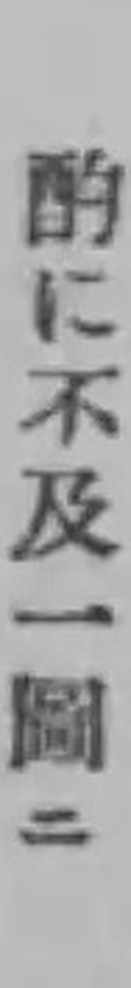酌に不及一国ニ
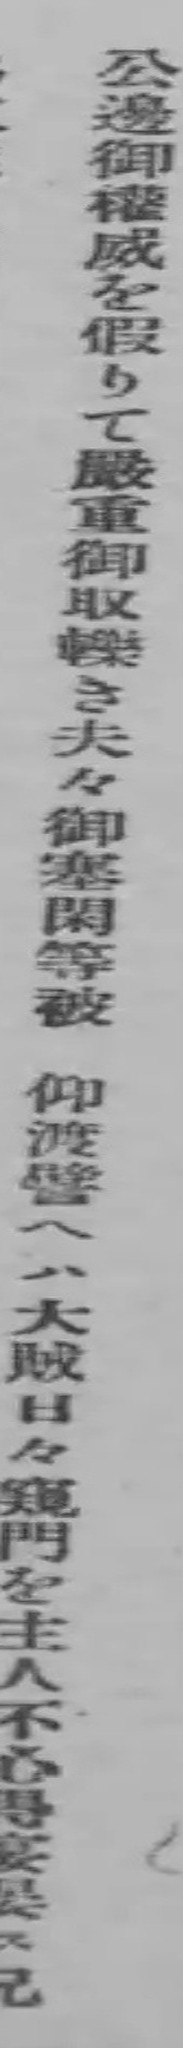公辺御権威を仮りて厳重御取轢き夫々御塞閉等被仰渡譬へは大賊日々窺門を主人不心得宴晏ス兄
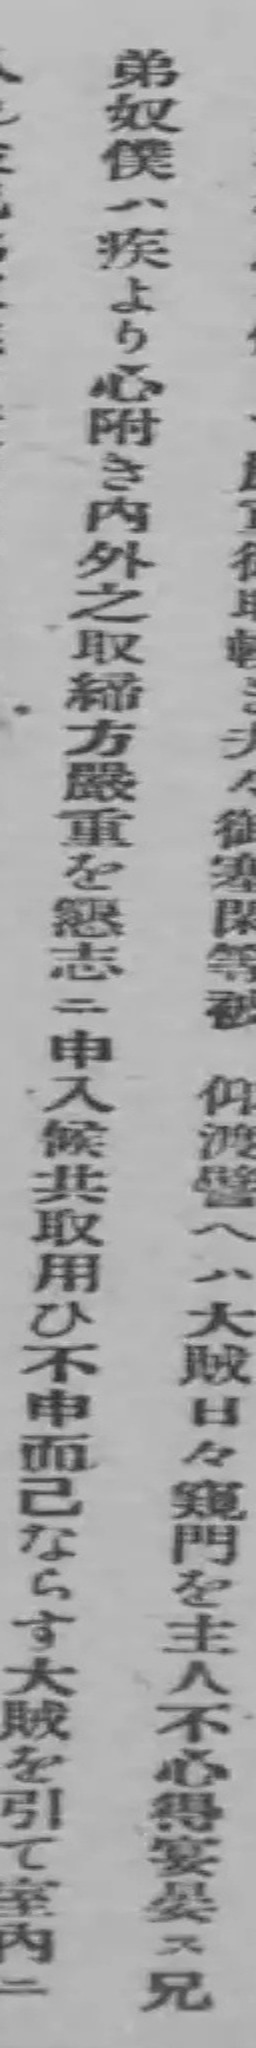弟奴僕は疾より心附き内外之取締方厳重を懇志に申入候共取用ひ不申而己ならす大賊を引て室内ニ
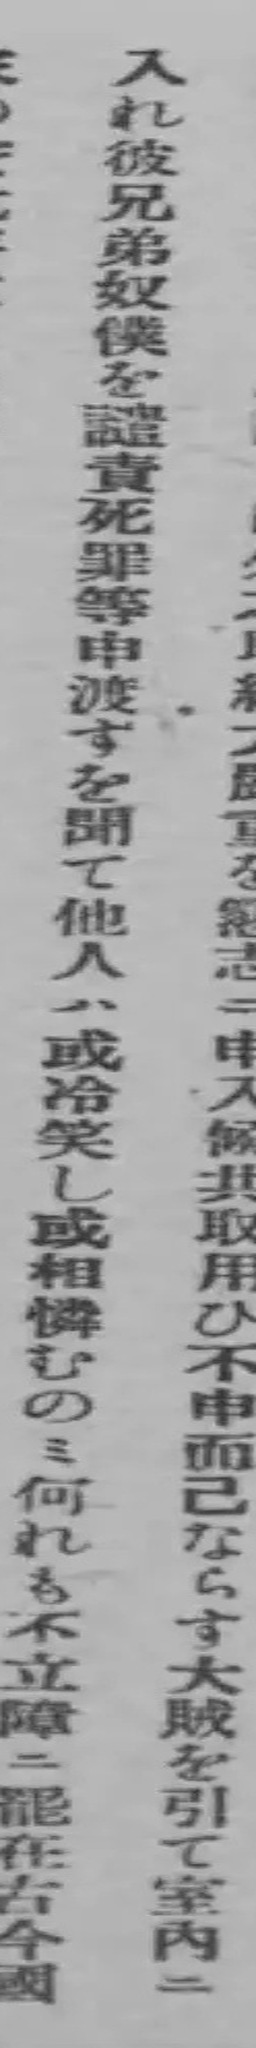入れ彼兄弟奴僕を譴責死罪等申渡すを聞て他人ハ或冷笑し或相憐むのみ何れも不立障ニ罷在古今国
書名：豊橋市史談
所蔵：国立国会図書館 National Diet Library, JAPAN
